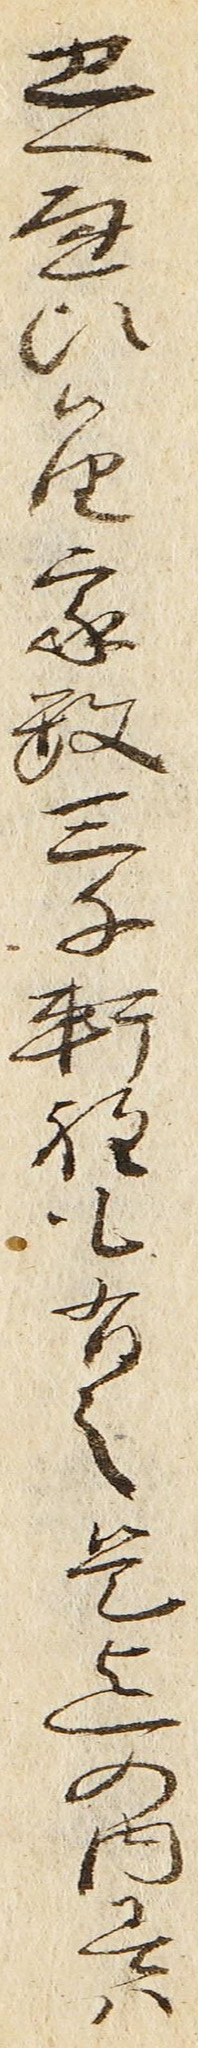辺へ通ひ候由家数三千軒程も有之是迄の内にては
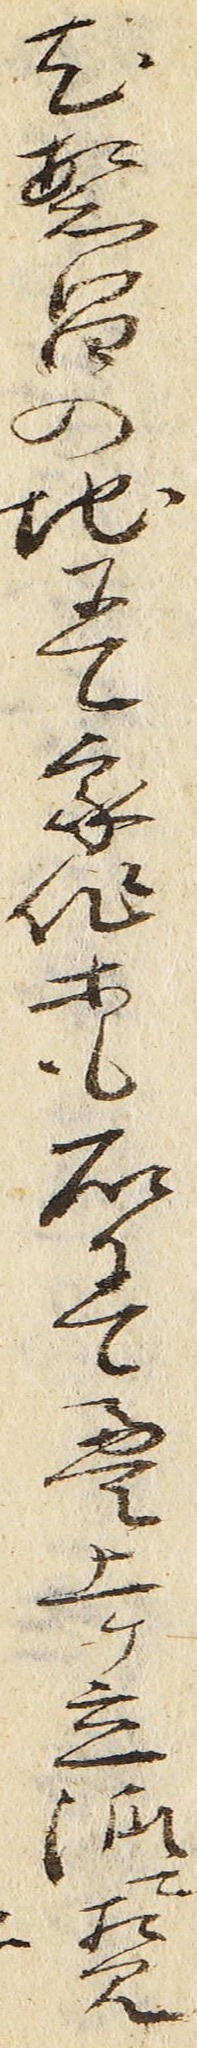尤繁昌の地にて家作等も石にて畳上ヶ立派に相見
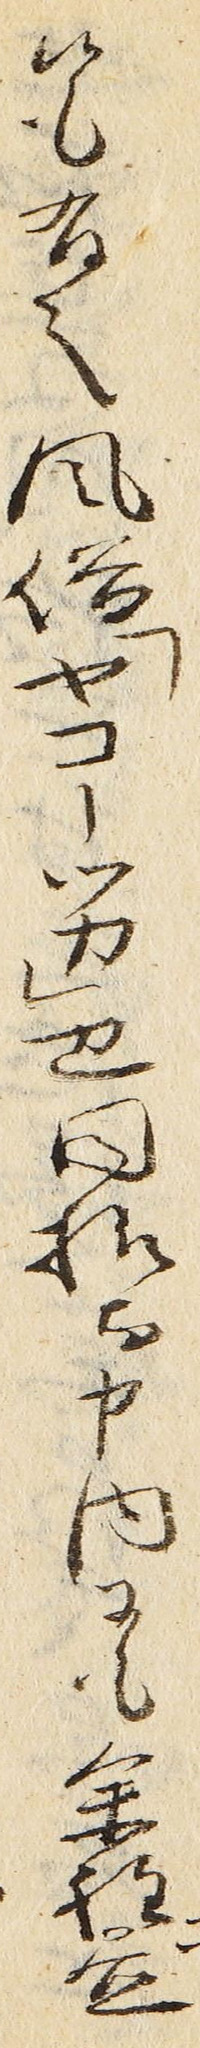候も有之風俗「ヤコーツカ」辺同様と申内にも余程品宜
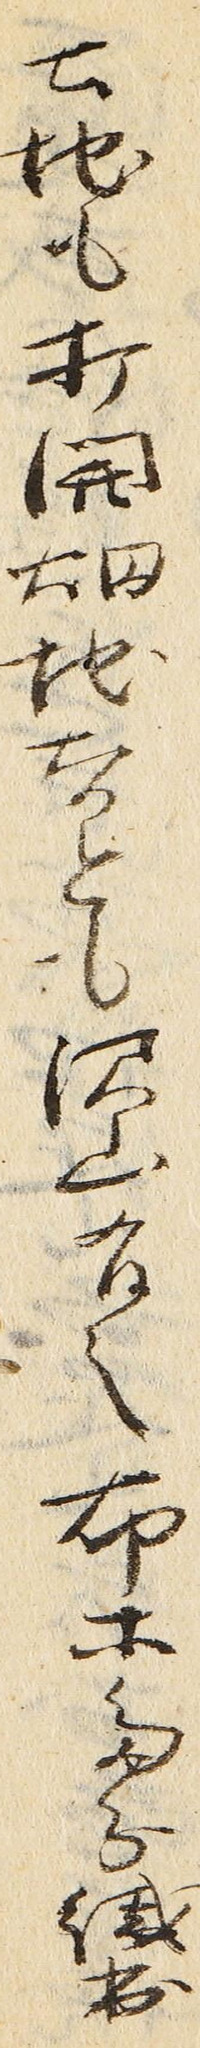土地も打開畑地なとも沢山有之布等多分織出
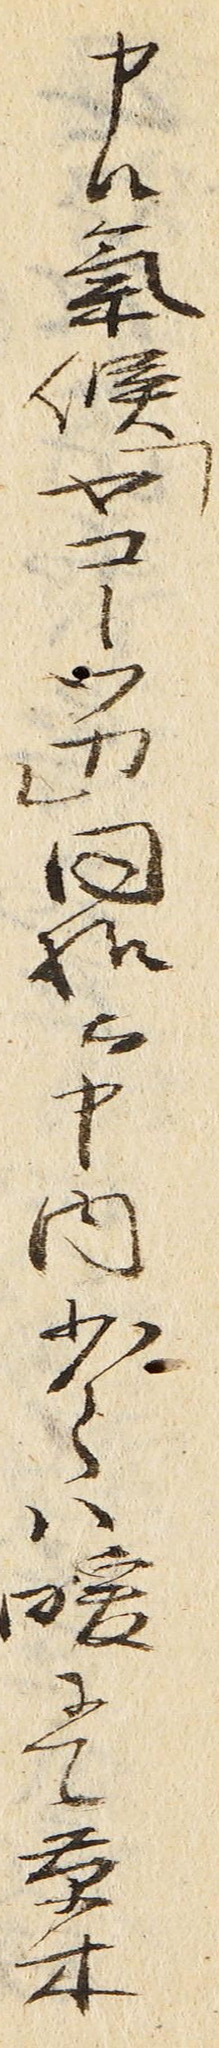申候気候「ヤコーツカ」同様と申内少々は暖にて草木
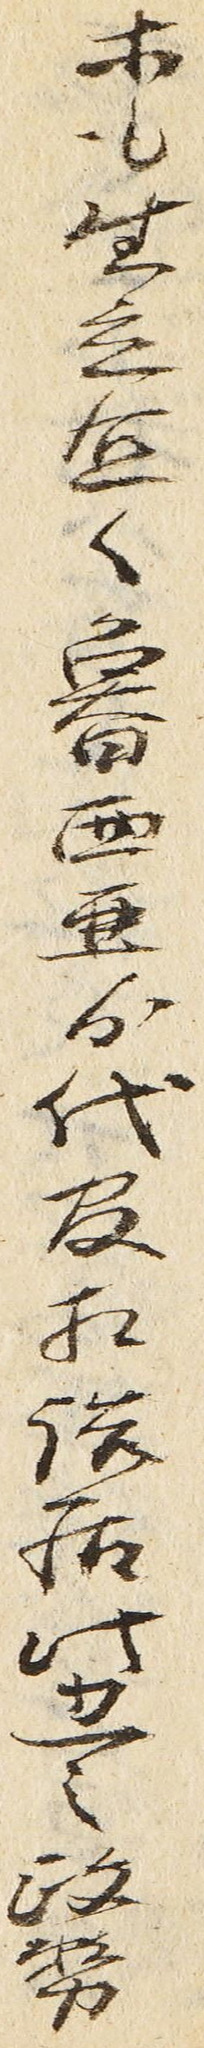等も生立宜く魯西亜ゟ代官相詰居此辺之政務
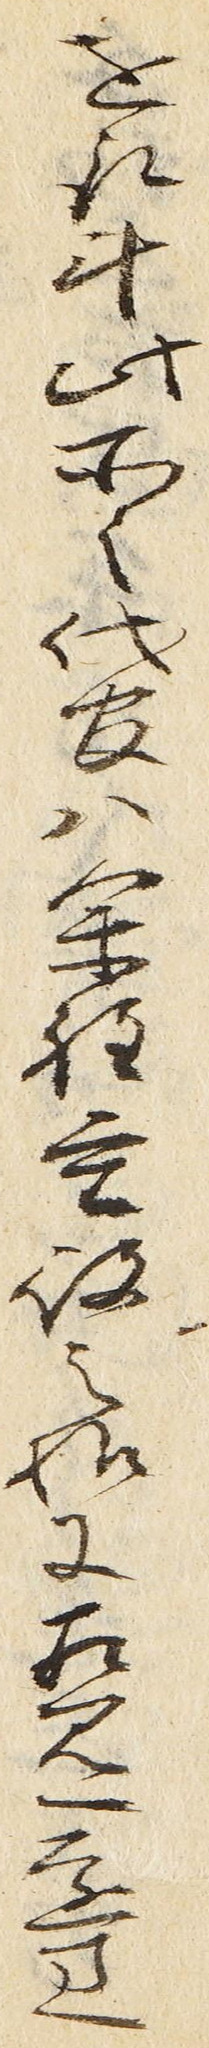を取斗此所之代官は余程重役之様に相見へ遠方へ
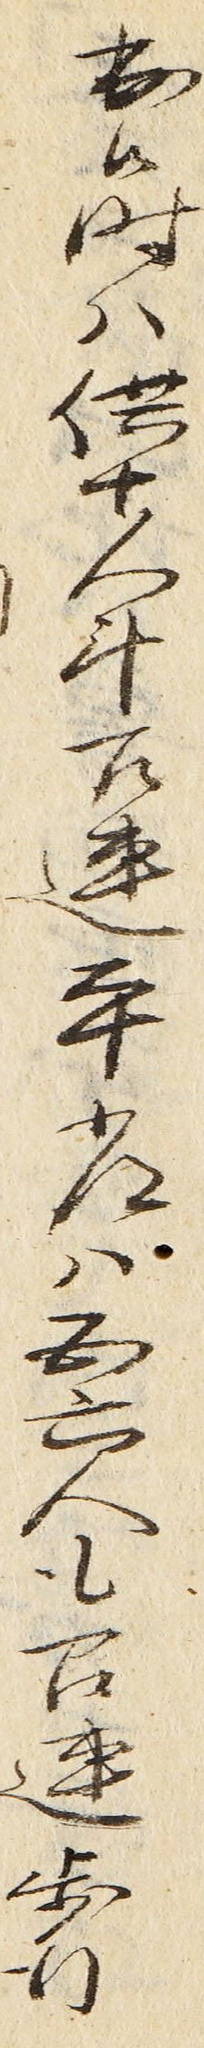出候時は供十人斗召連平常は五六人も召連歩行
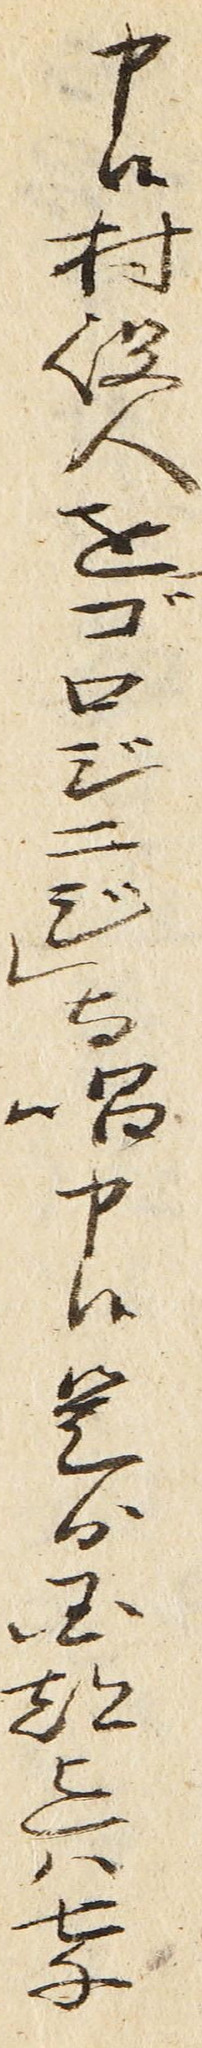申候村役人を「ゴロジニジ」と唱申候是ゟ国都迄は七千
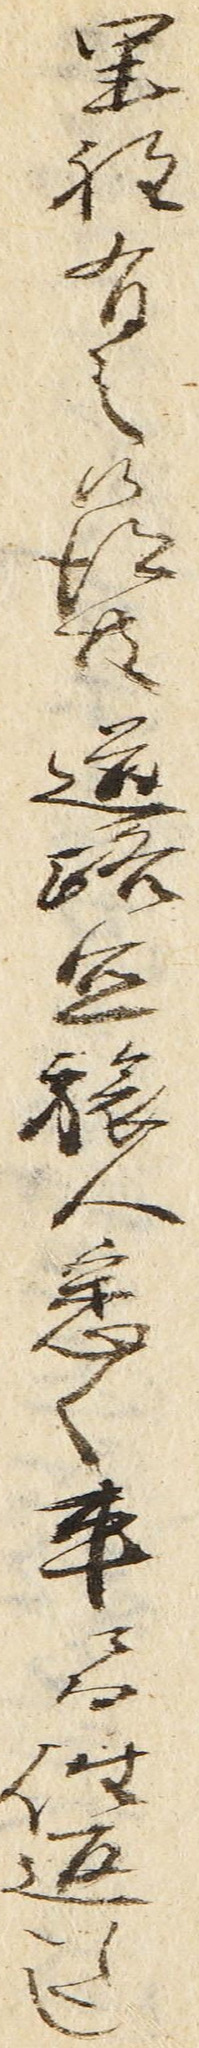里程有之候得共道路宜旅人悉く車にて往返いたし
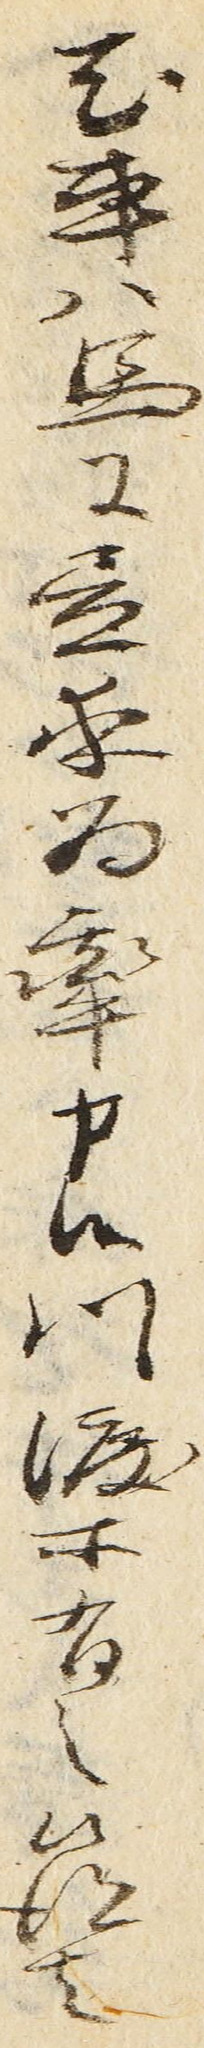尤車は馬に昼夜為牽申候川渡等有之候得は
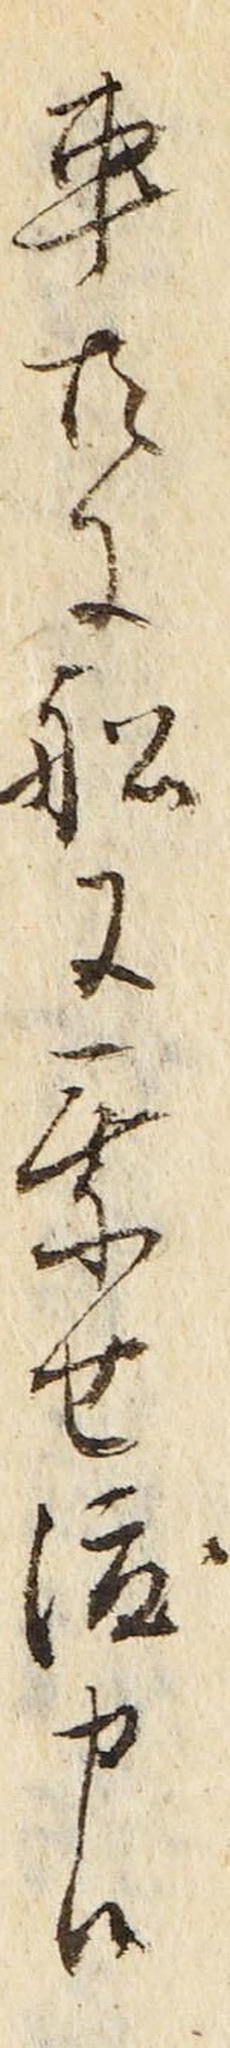車共に船に乗せ渡申候
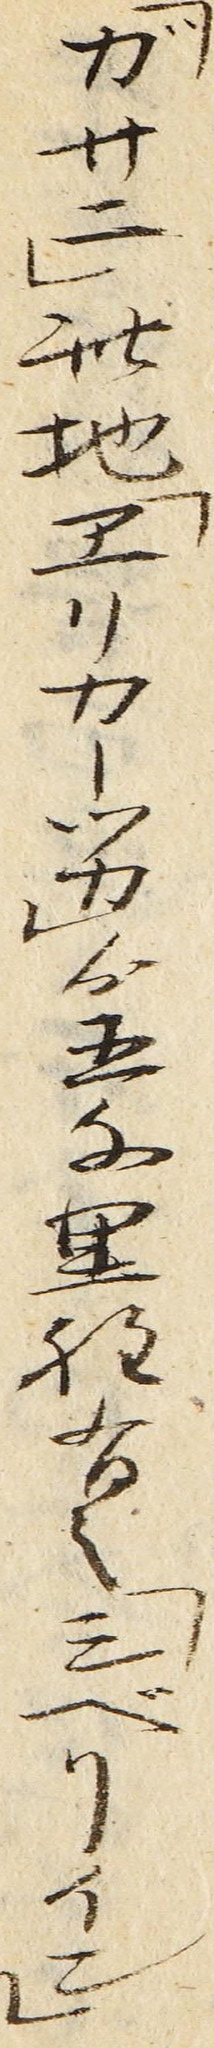「ガサニ」此地「ヱリカーツカ」ゟ五千里程有之「シベリイン」
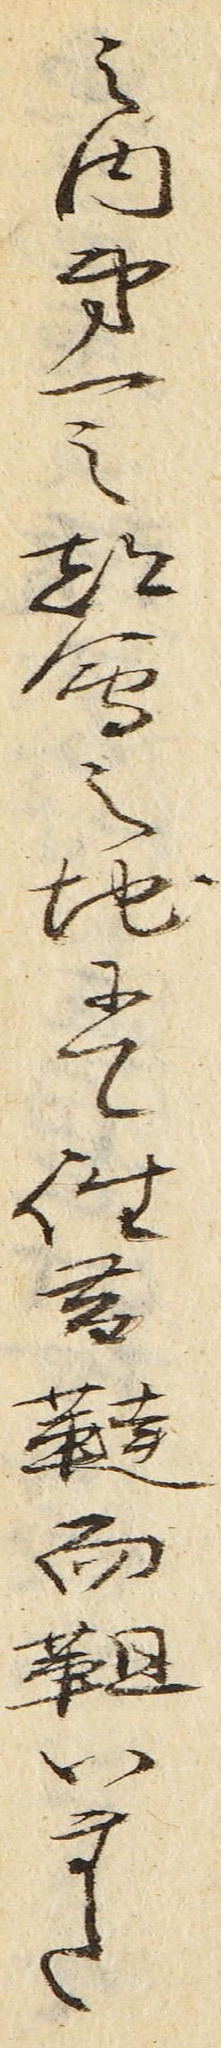之内第一之都会之地にて往昔韃而靼いまた

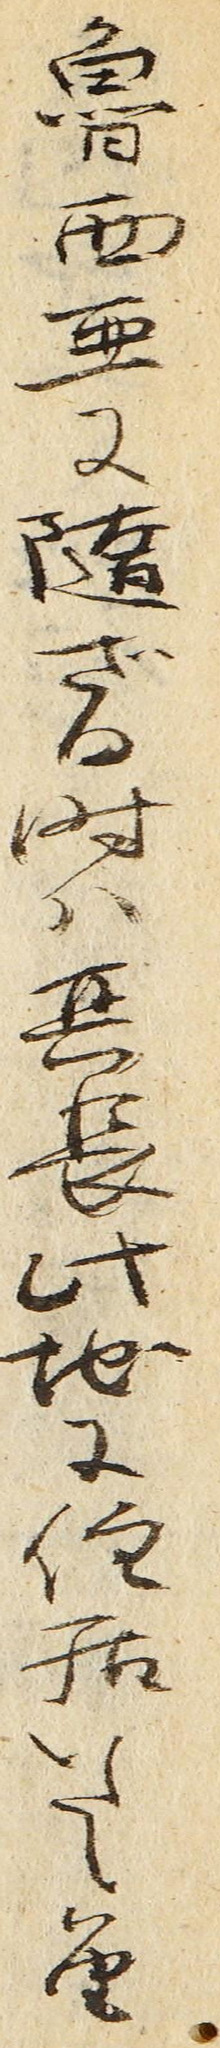魯西亜に随ざる時は其長此地に住居いたし候由
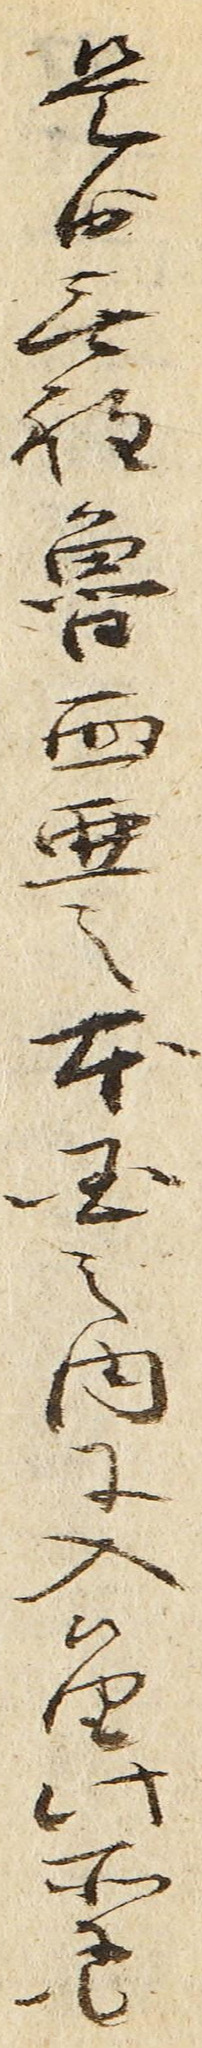是ゟ無程魯西亜之本国之内に入候由此所にも
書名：漂民後記
